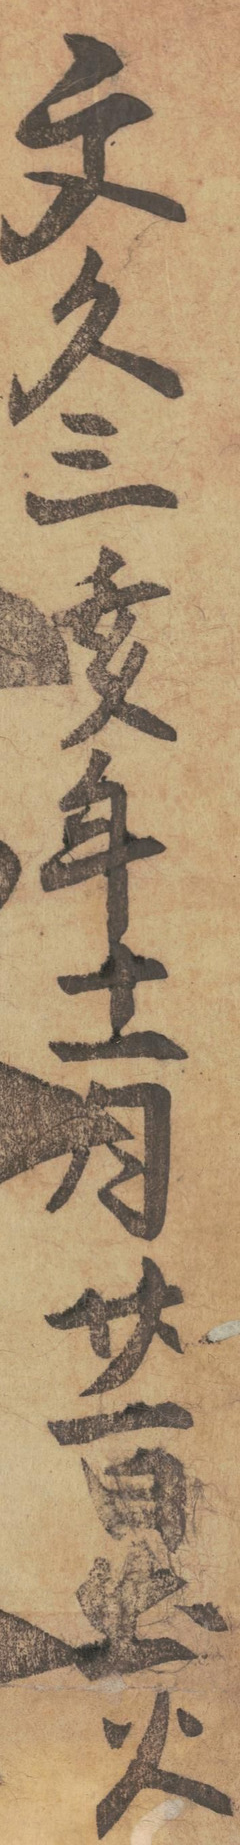文久三亥年十一月廿一日出火
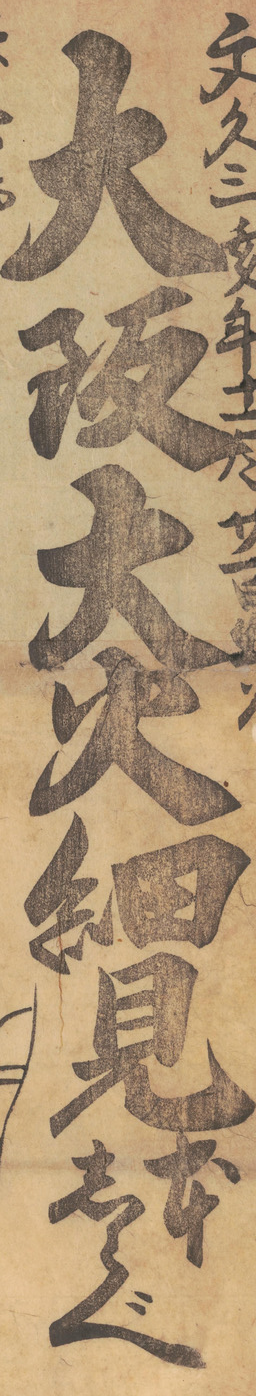大阪大火細見本しらべ
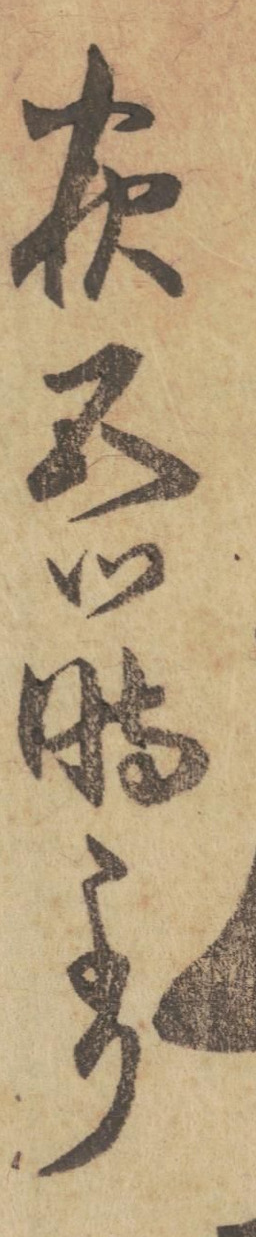夜五ツ時より
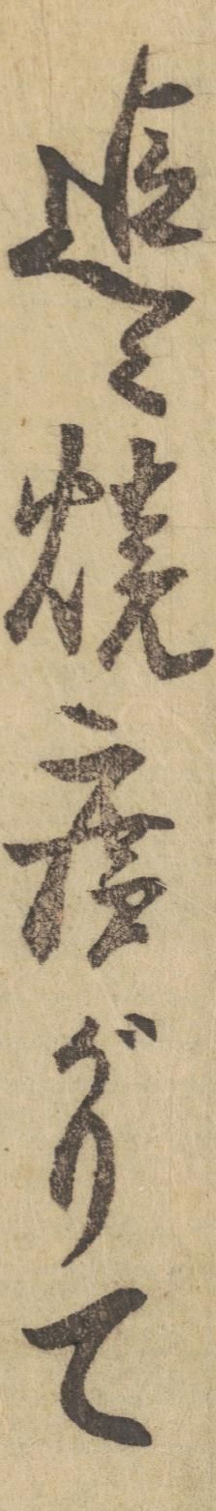追々焼広がりて
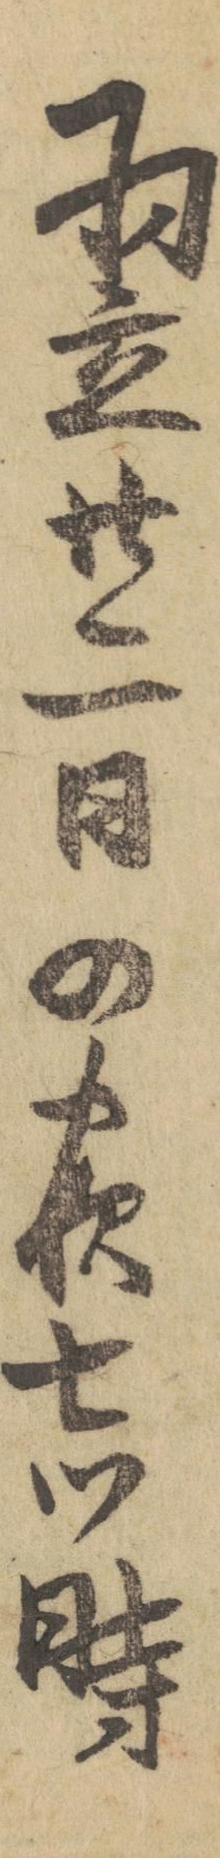翌廿二日の夜七ツ時
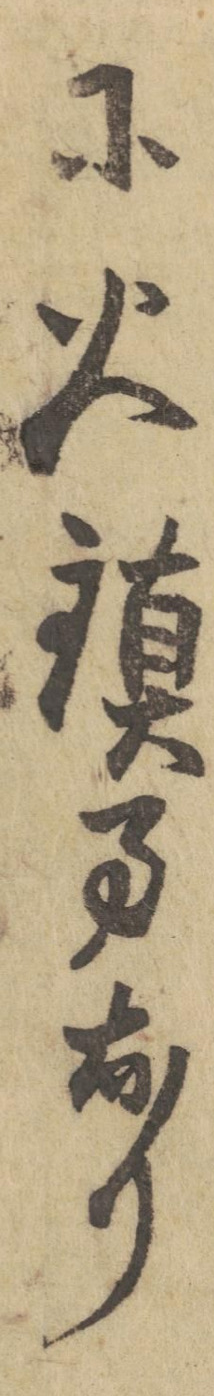に火鎮事なり
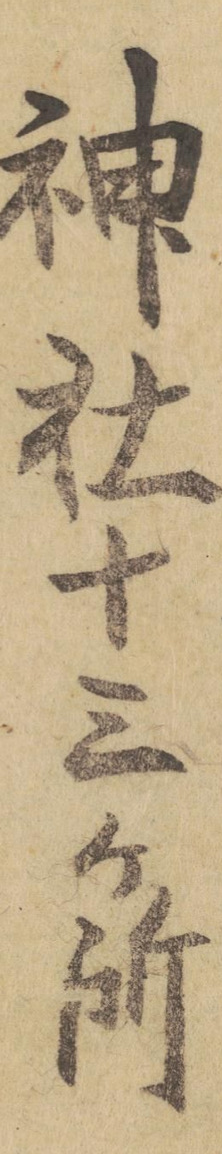神社十三ヶ所
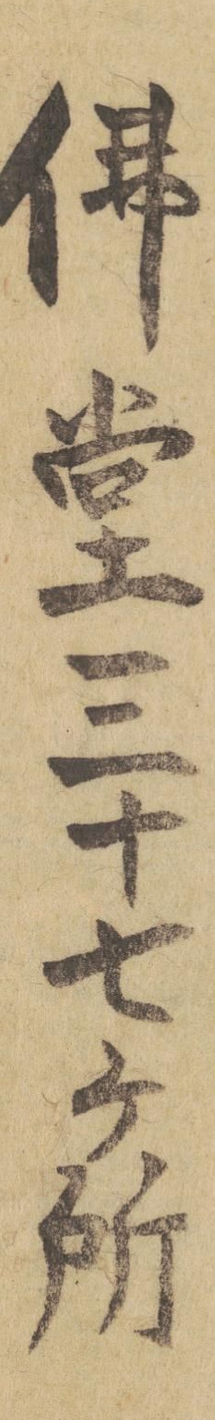仏堂三十七ヶ所
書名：文久三亥年十一月廿一日出火　大阪大火細見　本しらべ
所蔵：東京大学地震研究所図書室 Earthquake Research Institute Library, The University of Tokyo, JAPAN
